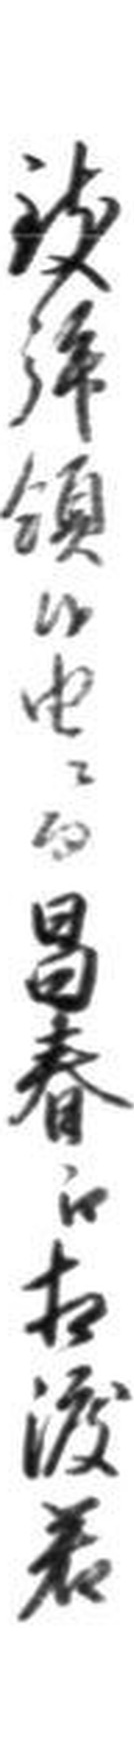致拝領候由ニ而昌春江相渡若
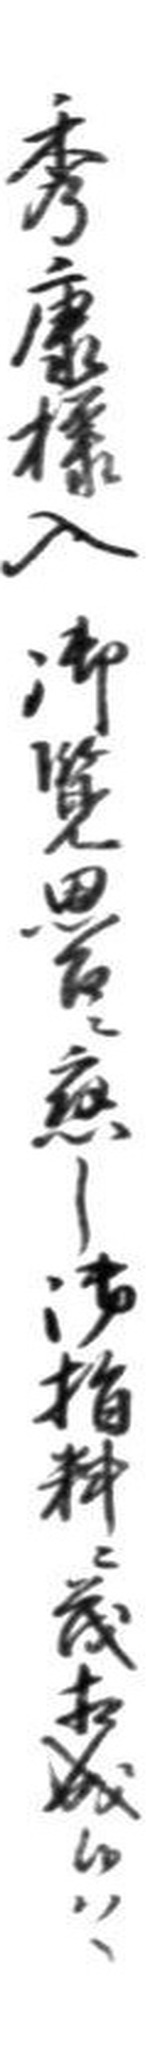秀康様入御覧思召ニ応し御指料ニも相成候ハヽ
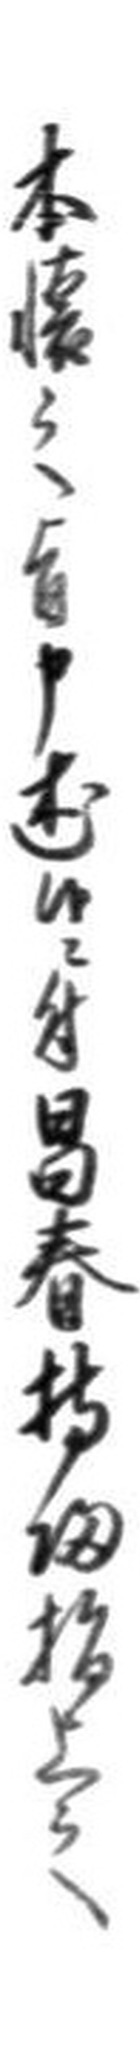本懐之旨申述候ニ付昌春持帰指上之
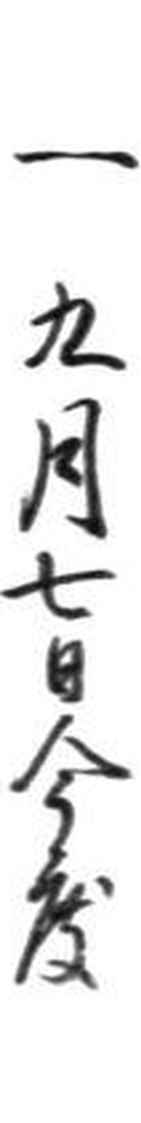一九月七日今度
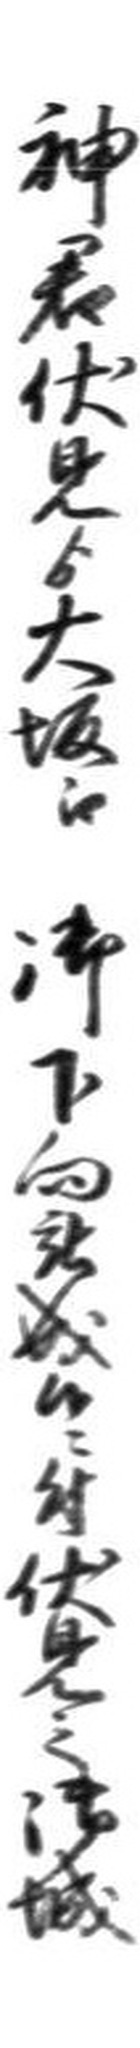神君伏見ゟ大坂江御下向被成候ニ付伏見之御城
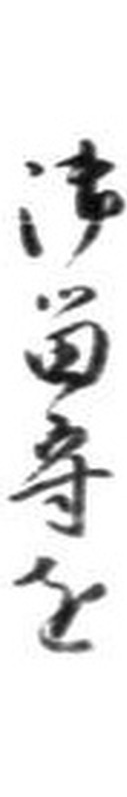御留守を
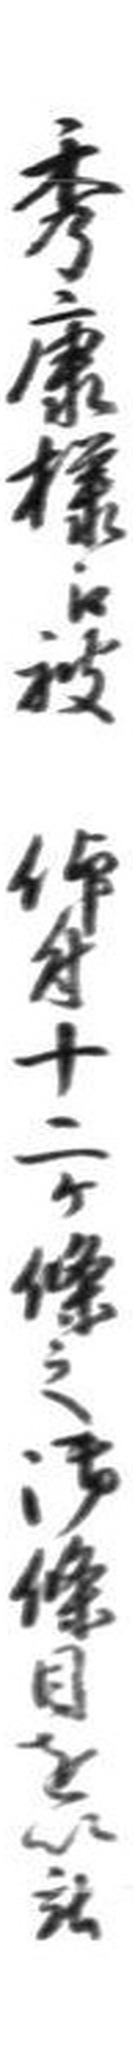秀康様江被仰付十二ヶ条之御条目を以被
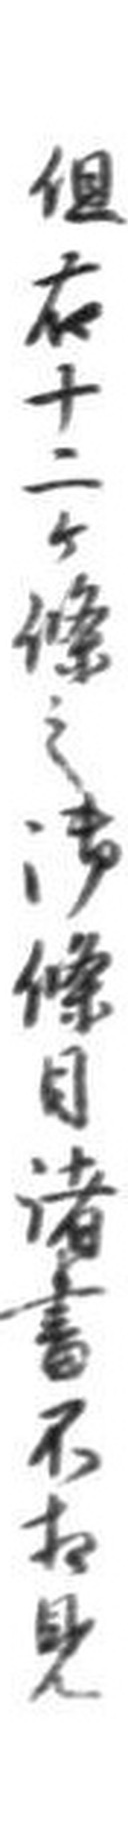但右十二ヶ条之御条目諸書不相見
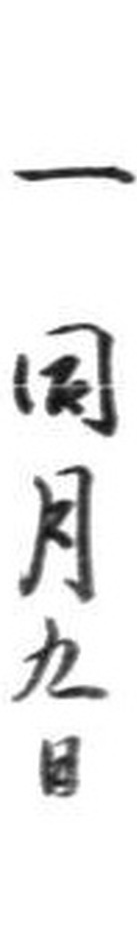一同月九日
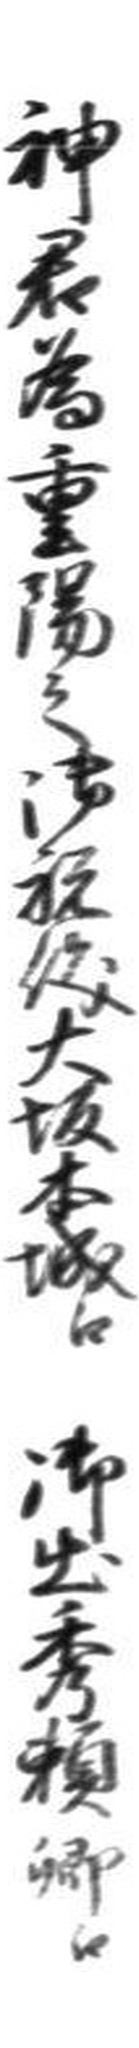神君為重陽之御祝儀大坂本城江御出秀頼卿江
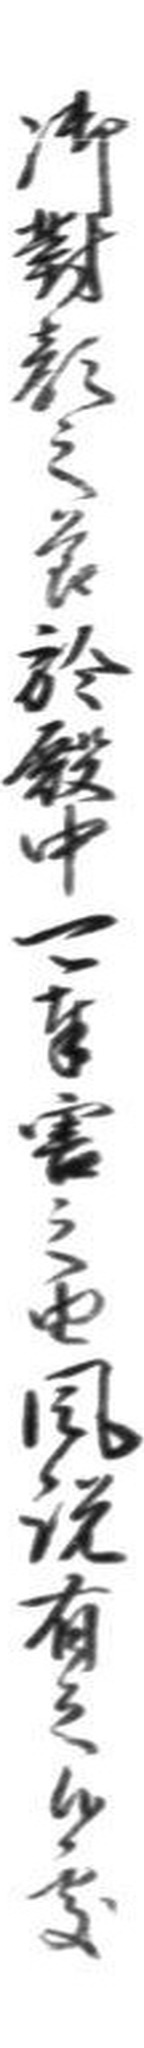御対顔之節於殿中可奉害之由風説有之候処

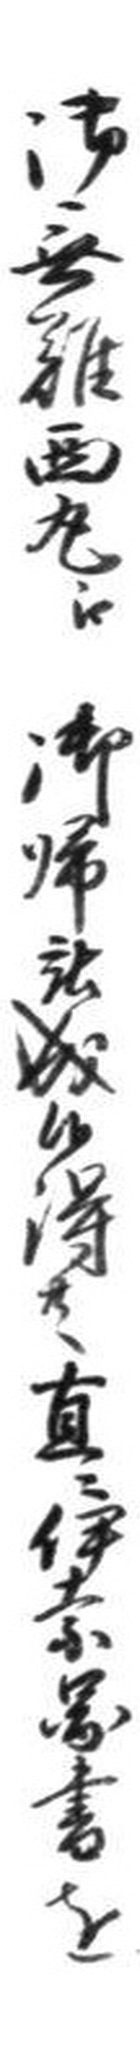御無難西丸江御帰被成候得共直ニ伊奈図書を
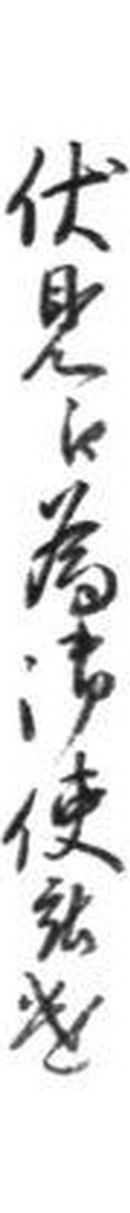伏見江為御使被遣
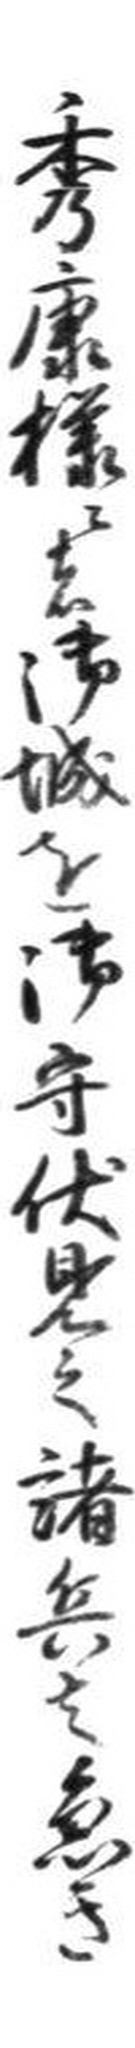秀康様ニ者御城を御守伏見之諸兵者急き
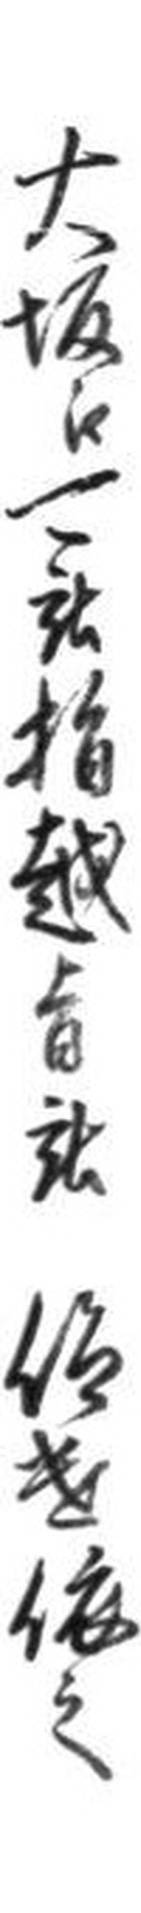大坂江可被指越旨被仰遣依之
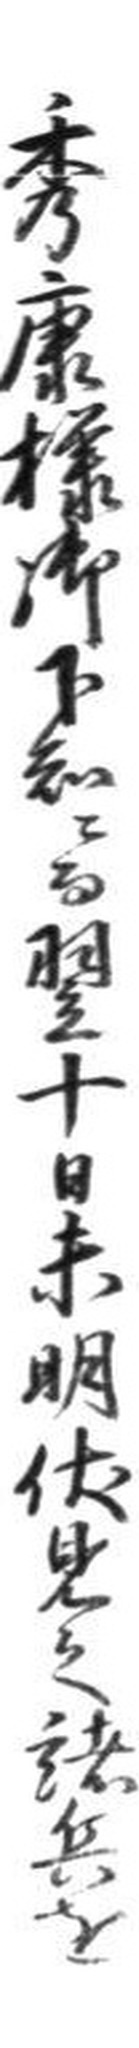秀康様御下知ニ而翌十日未明伏見之諸兵を
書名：家譜 一 秀康公 従天正二年到慶長十二年
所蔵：福井県文書館 Fukui Prefectural Archives
